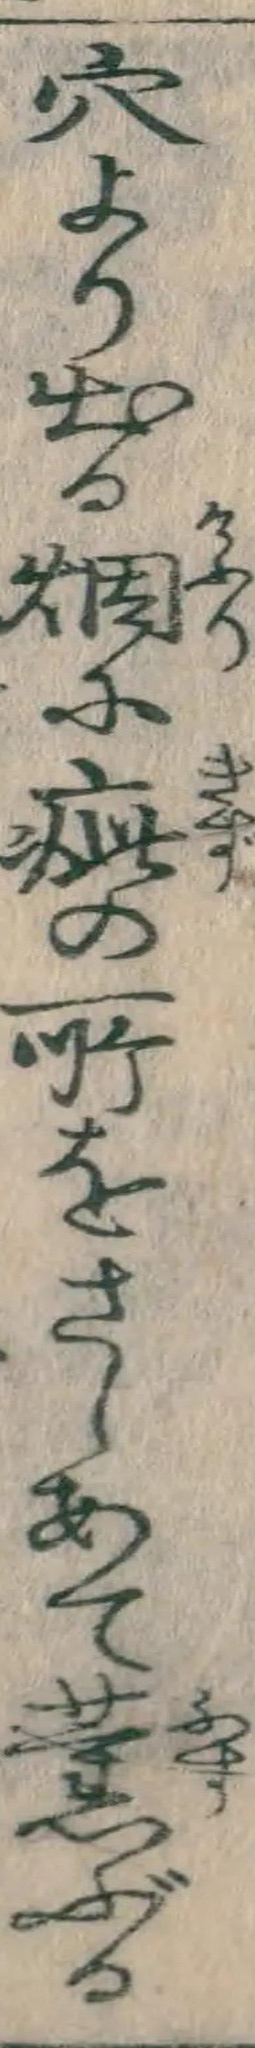穴より出る煙に疵の所をさしあて薫ぶる
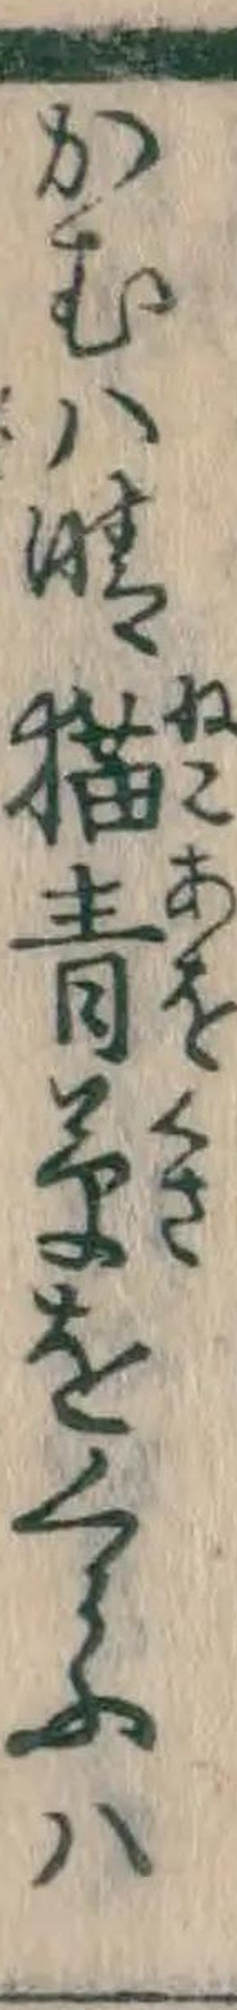かむは晴猫青草をくらふは
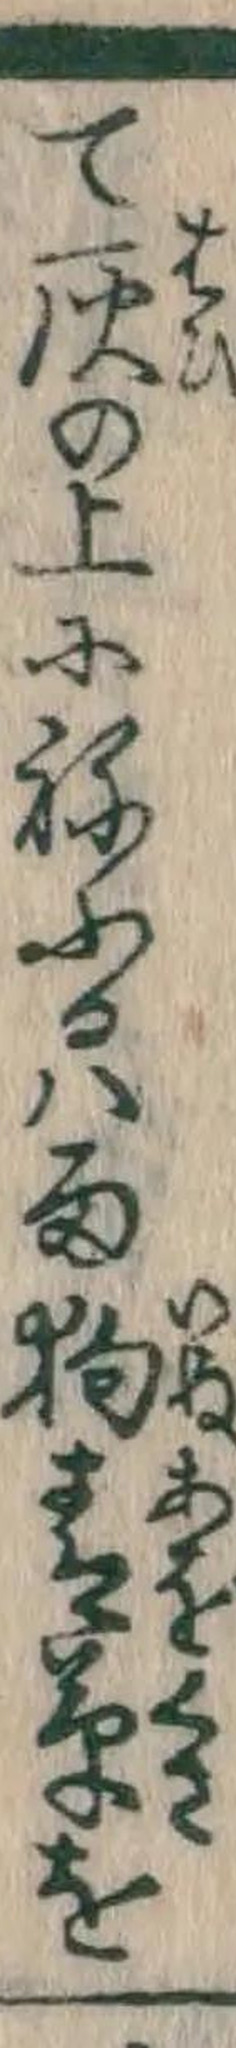て灰の上にねふるは雨狗青草を
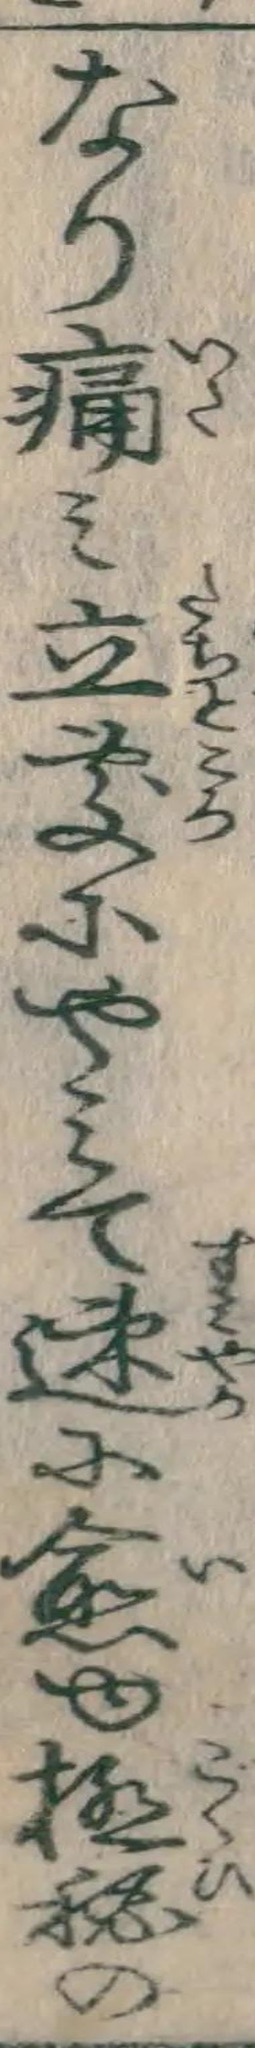なり痛み立処にやみて速に愈ゆ極秘の
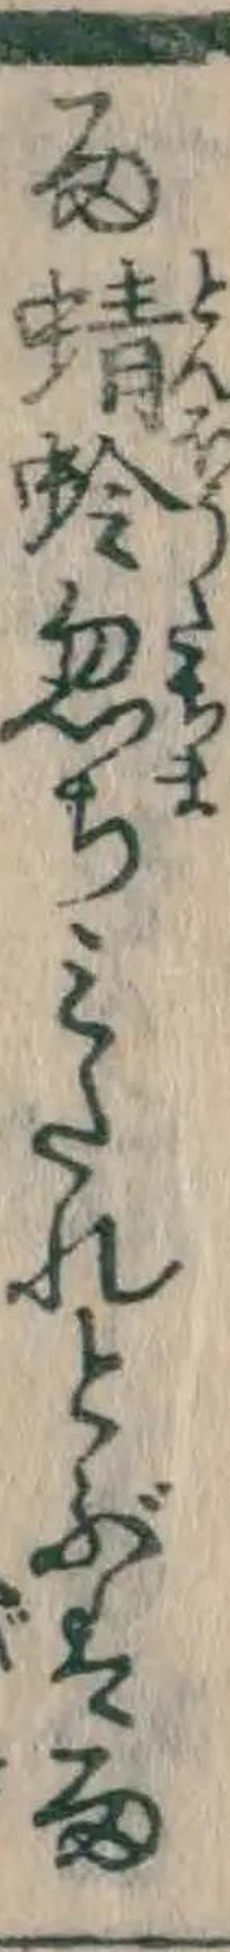雨蜻蛉忽ちみたれとぶは雨
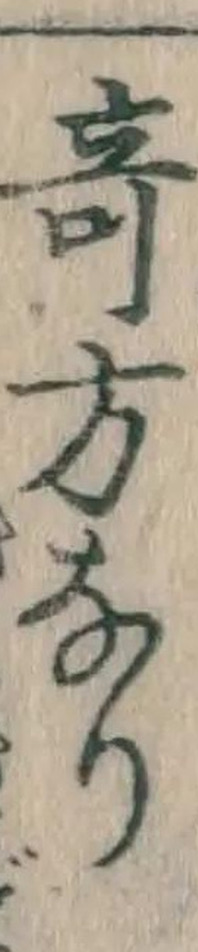奇方なり
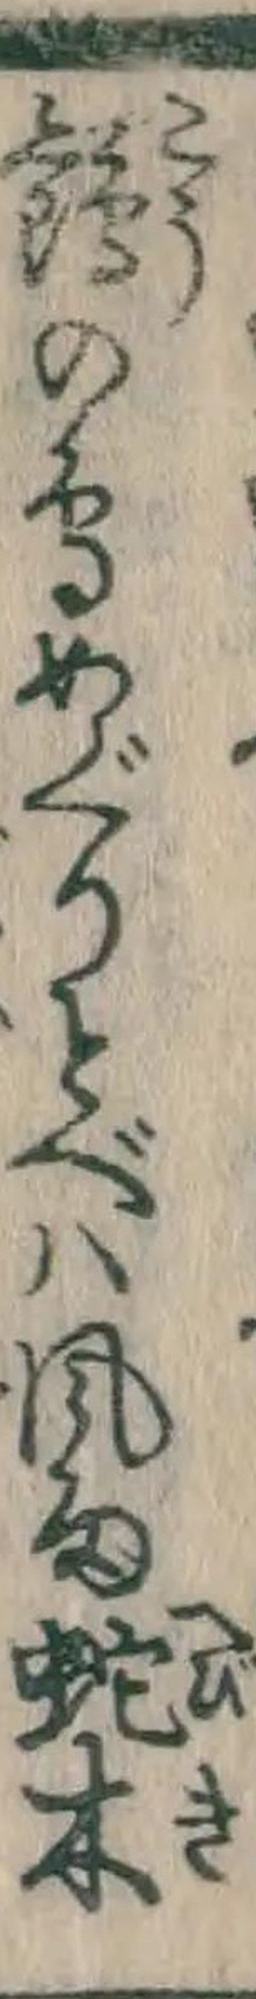鸛の鳥めぐりとべは風雨蛇木
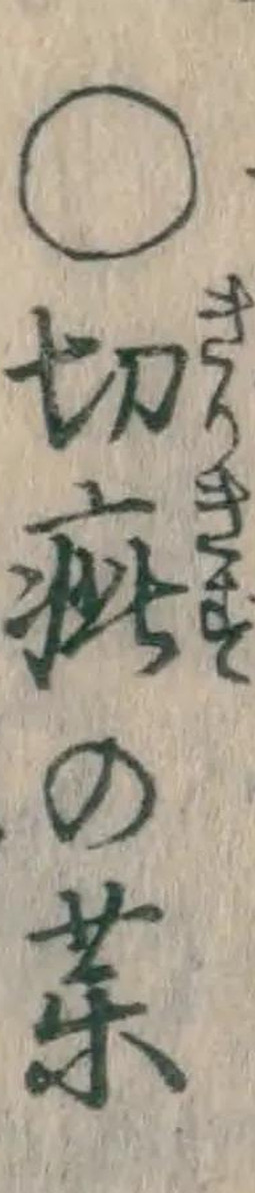○切疵の薬
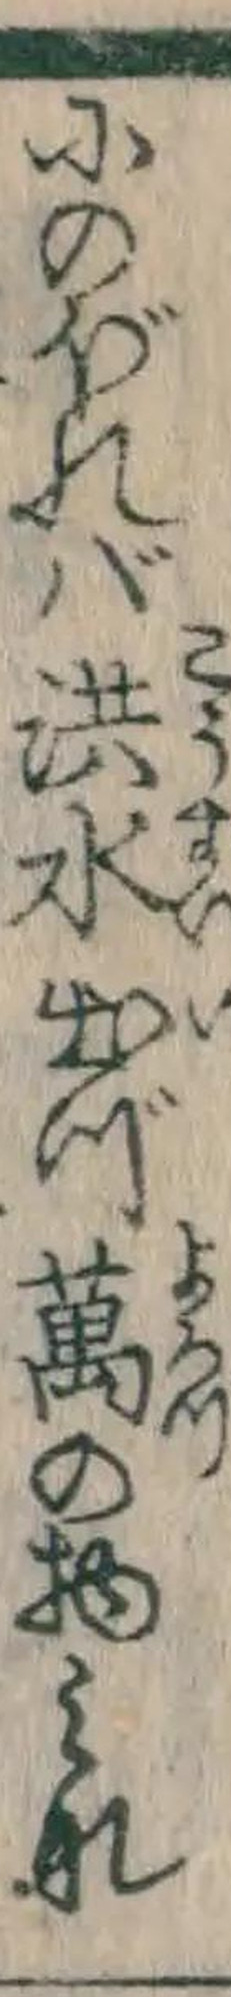にのぼれば洪水出づ万の物みな
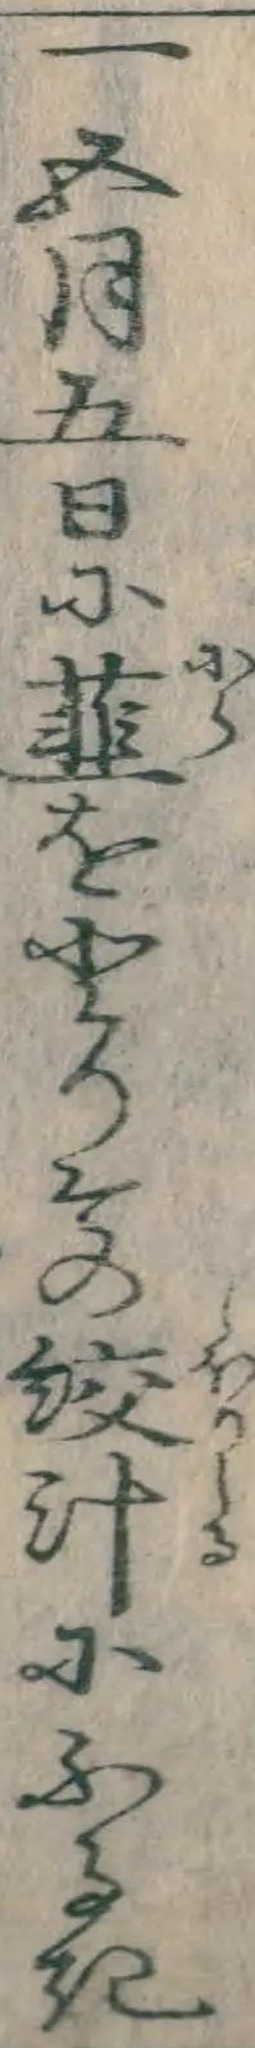一五月五日に韮をとりその絞汁にふるき
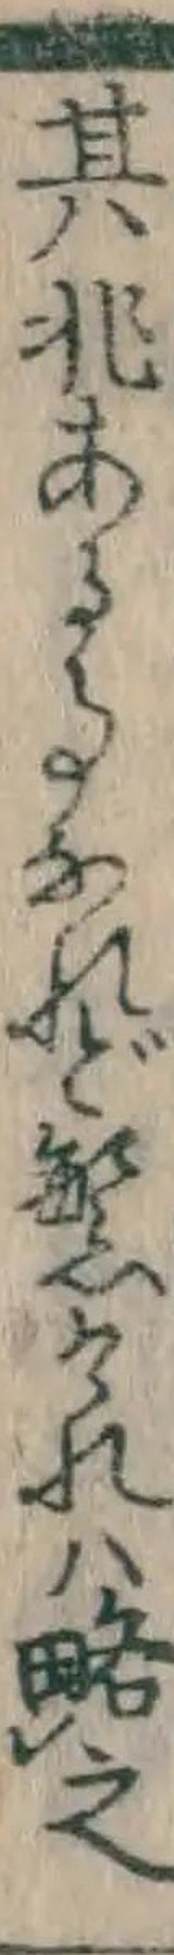其兆ある事なれど繁けれは略之
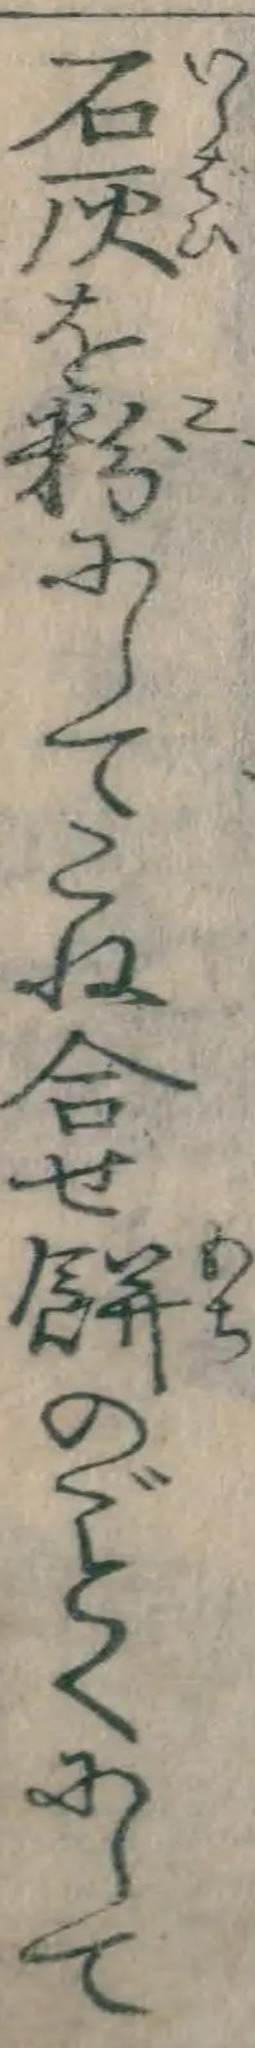石灰を粉にしてこね合せ餅のごとくにして

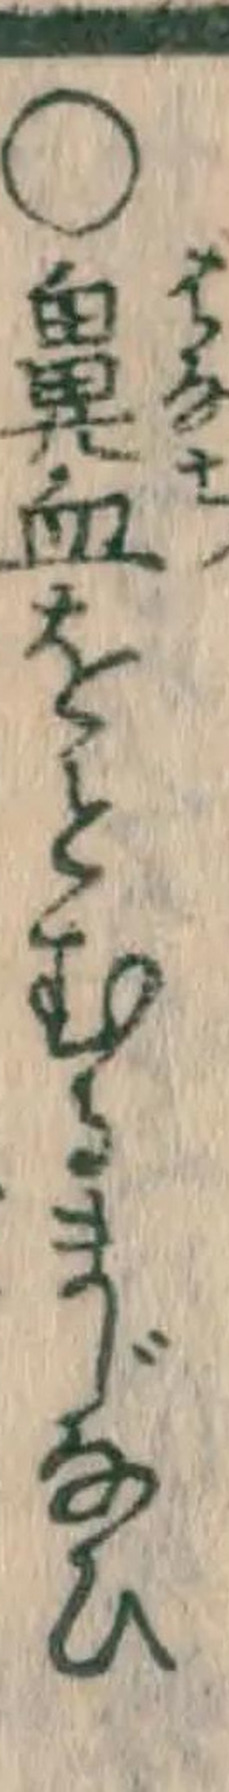○鼻血をとむるまじなひ
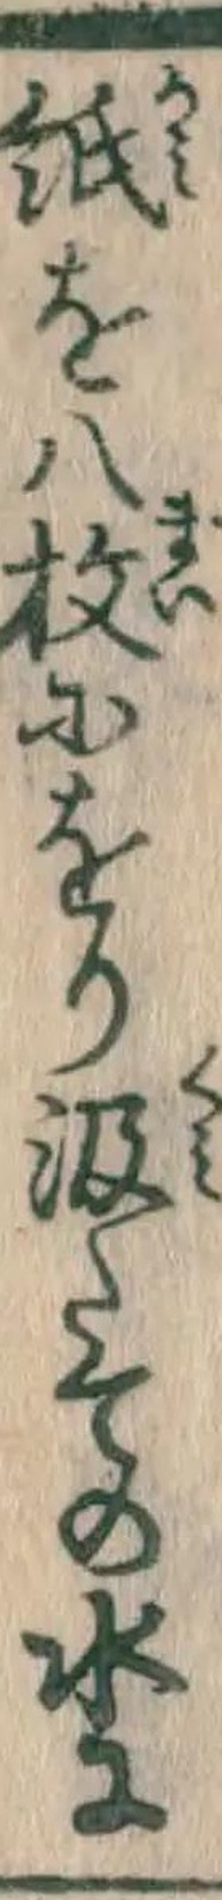紙を八枚にをり汲たての水に
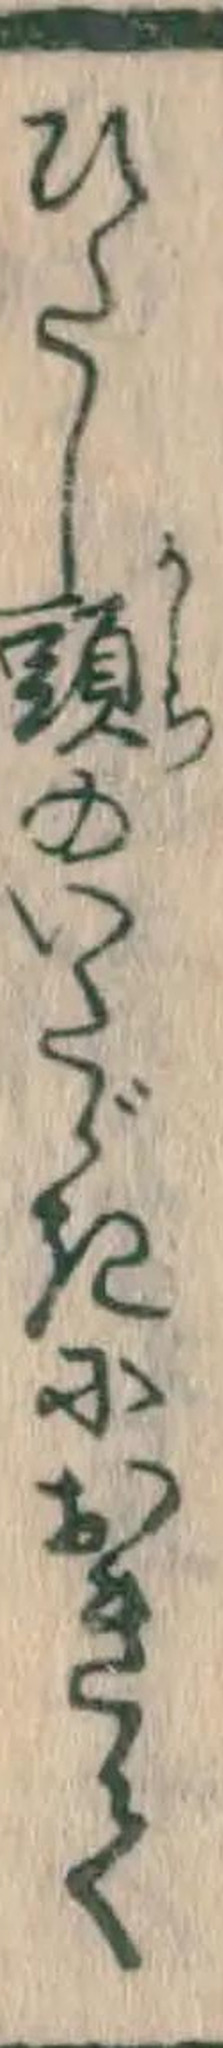ひたし頭のいたゞきにおきて
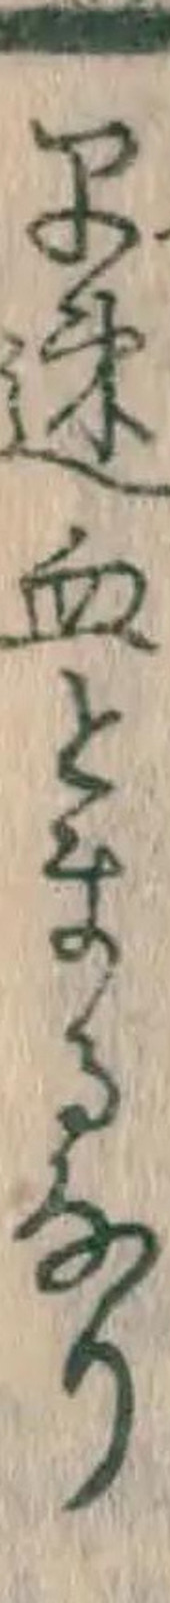早速血とまるなり
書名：広益秘事大全 3巻. [4]
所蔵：国立国会図書館 National Diet Library, JAPAN
